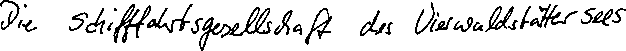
Die Schifffahrtsgesellschaft des Vierwaldstättersees
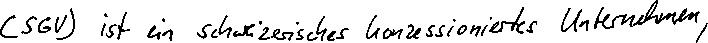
(SGV) ist ein schweizerisches konzessioniertes Unternehmen,
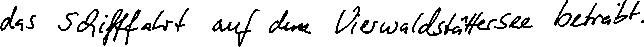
das Schifffahrt auf dem Vierwaldstättersee betreibt.
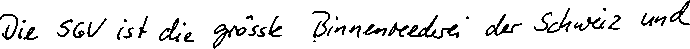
Die SGV ist die grösste Binnenreederei der Schweiz und
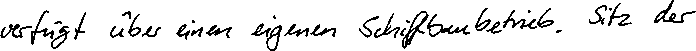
verfügt über einen eigenen Schiffbaubetrieb. Sitz der
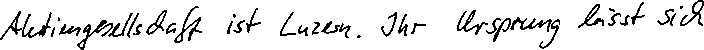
Aktiengesellschaft ist Luzern. Ihr Ursprung lässt sich
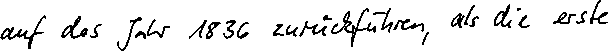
auf das Jahr 1836 zurückführen, als die erste
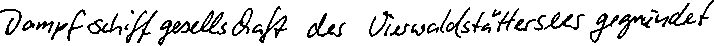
Dampfschiffgesellschaft des Vierwaldstättersees gegründet
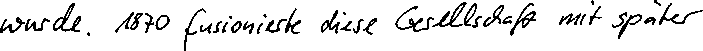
wurde. 1870 fusionierte diese Gesellschaft mit später
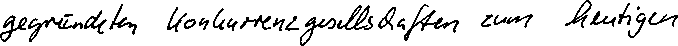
gegründeten Konkurrenzgesellschaften zum heutigen
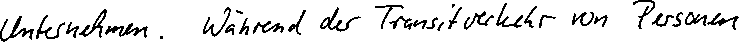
Unternehmen. Während der Transitverkehr von Personen
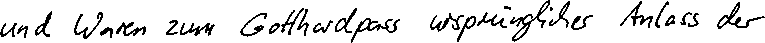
und Waren zum Gotthardpass ursprünglicher Anlass der
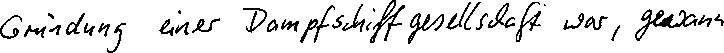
Gründung einer Dampfschiffgesellschaft war, gewann
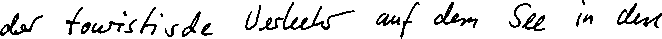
der touristische Verkehr auf dem See in den
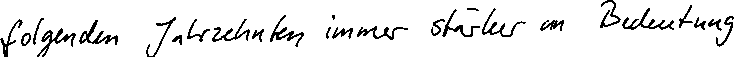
folgenden Jahrzehnten immer stärker an Bedeutung
